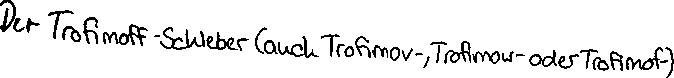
Der Trofimoff-Schieber (auch Trofimov-, Trofimow-, Troffimoff- oder Trofimof-)
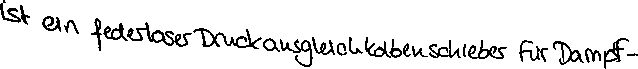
ist ein federloser Druckausgleichkolbenschieber für Dampf-
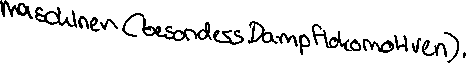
maschinen (besonders Dampflokomotiven).
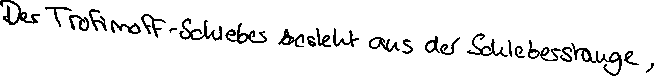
Der Trofimoff-Schieber besteht aus der Schieberstange,
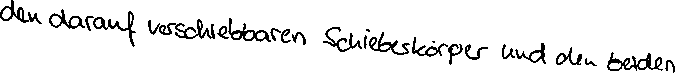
den darauf verschiebbaren Schieberkörpern und den beiden
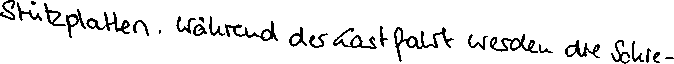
Stützplatten. Während der Lastfahrt werden die Schie-
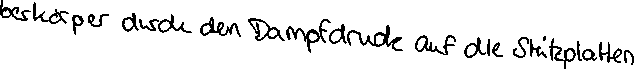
berkörper durch den Dampfdruck auf die Stützplatten
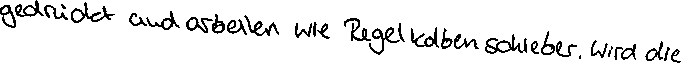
gedrückt und arbeiten wie Regelkolbenschieber. Wird die
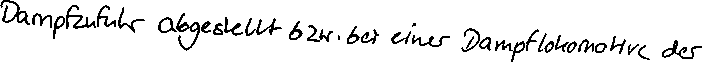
Dampfzufuhr abgestellt bzw. bei einer Dampflokomotive der
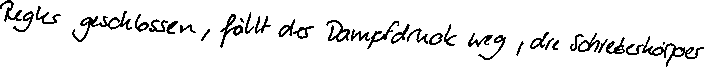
Regler geschlossen, fällt der Dampfdruck weg, die Schieberkörper
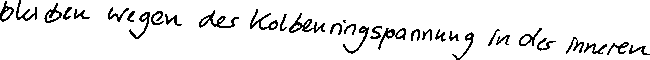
bleiben wegen der Kolbenringspannung in der inneren
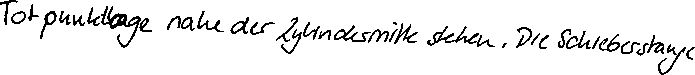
Totpunktlage nahe der Zylindermitte stehen. Die Schieberstange
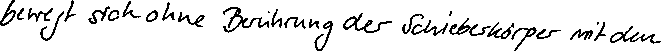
bewegt sich ohne Berührung der Schieberkörper mit den
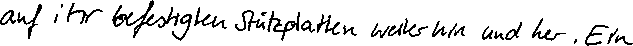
auf ihr befestigten Stützplatten weiter hin und her. Ein
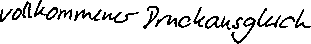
vollkommener Druckausgleich
